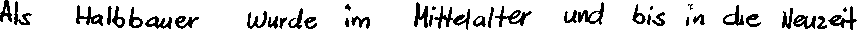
Als Halbbauer wurde im Mittelalter und bis in die Neuzeit
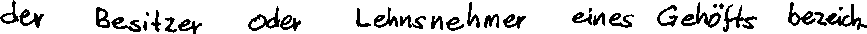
der Besitzer oder Lehnsnehmer eines Gehöfts bezeich-
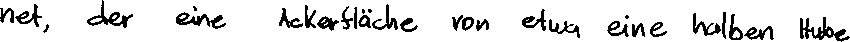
et, der eine Ackerfläche von etwa einer halben Hube
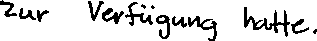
zur Verfügung hatte.
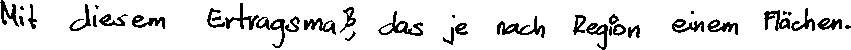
Mit diesem Ertragsmaß, das je nach Region einem Flächen.
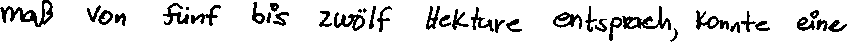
maß von fünf bis zwölf Hektar entsprach, konnte eine
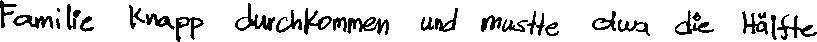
Familie knapp durchkommen und musste etwa die Hälfte
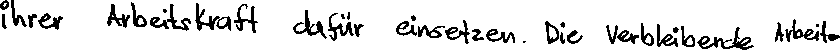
ihrer Arbeitskraft dafür einsetzen. Die verbleibende Arbeit-
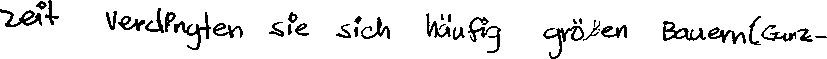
zeit verdingten sie sich häufig bei größeren Bauern (Ganz-
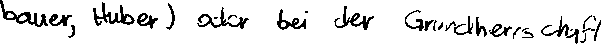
bauer, Huber) oder bei der Grundherrschaft
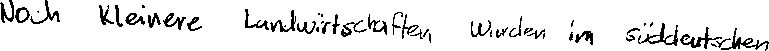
Noch kleinere Landwirtschaften wurden im süddeutschen
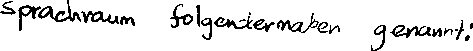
Sprachraum folgendermaßen genannt:
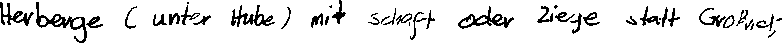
Herberge (unter Hube) mit Schaf oder Ziege statt Großvieh;
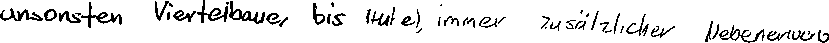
ansonsten Viertelbauer bis Hube), immer zusätzlicher Nebenerwerb
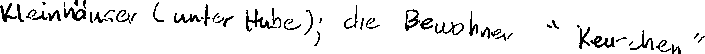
Kleinhäusler (unter Hube); die Bewohner solcher "Keuschen"
